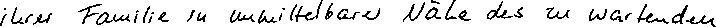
ihrer Familie in unmittelbarer Nähe des zu wartenden
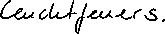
Leuchtfeuers.
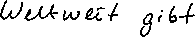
Weltweit gibt
